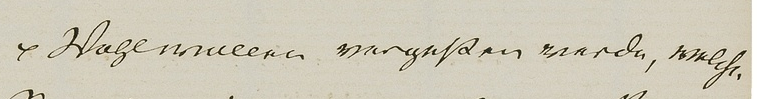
& Wohlwollen vergeßen werde, welche
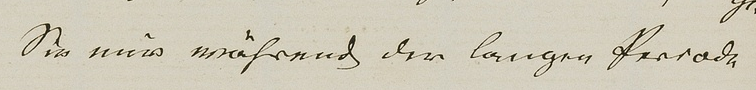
Sie mir während der langen Periode
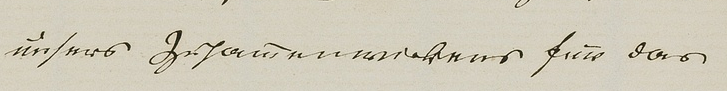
unseres Zusammenwirkens für das
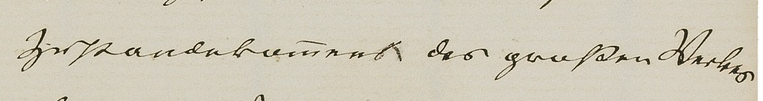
Zustandekommen des großen Werkes
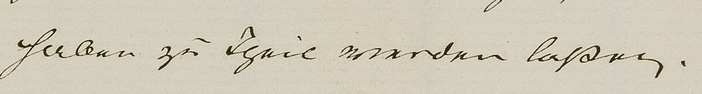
haben zu Theil werden laßen.
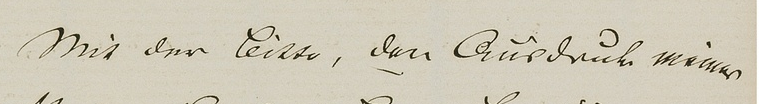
Mit der Bitte, den Ausdruk meiner
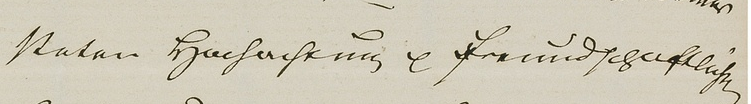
steten Hochachtung & freundschaftlichen
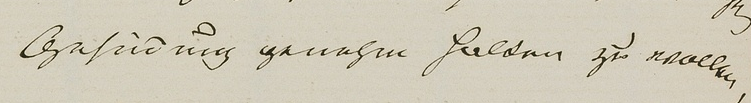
Gesinnung genehm halten zu wollen,
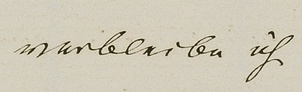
verbleibe ich
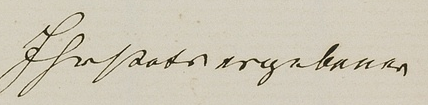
Ihr stets ergebener
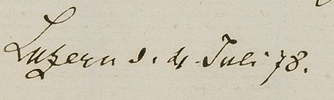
Luzern d. 4. Juli 78.
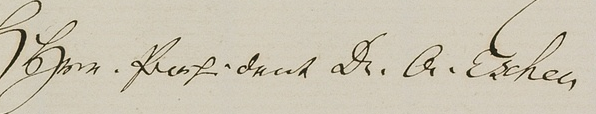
HHrn. Präsident Dr. A. Escher
